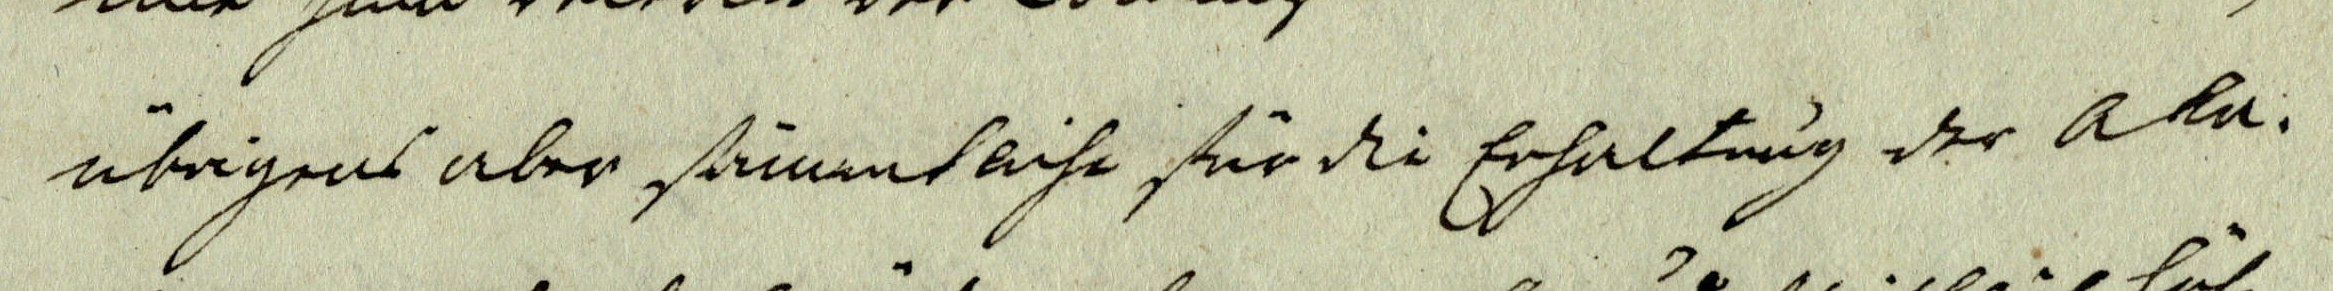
übrigens aber sämmtliche für die Erhaltung der Aka¬
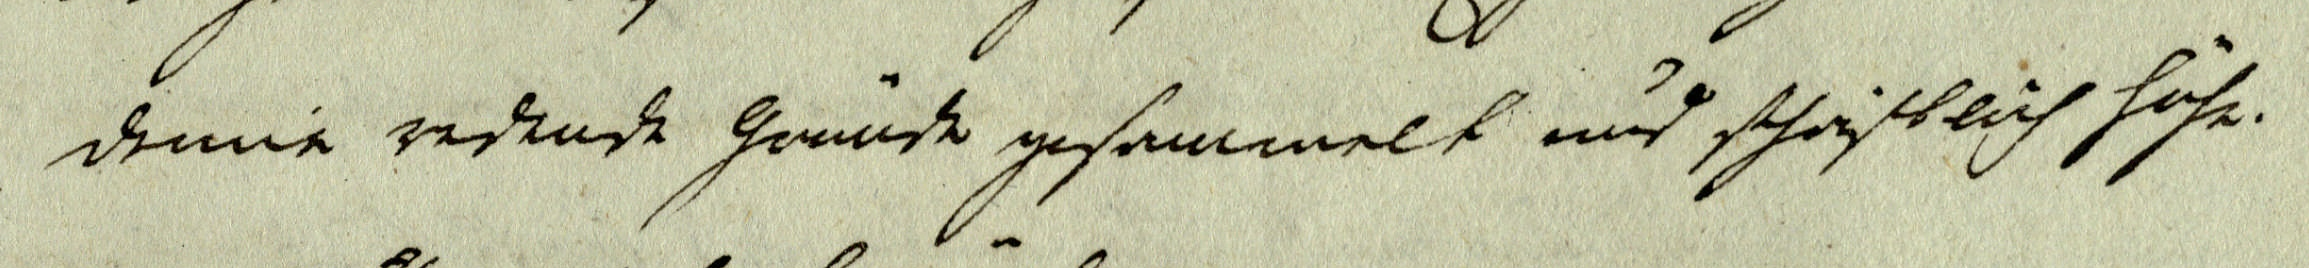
demie redende Gründe gesammelt und schriftlich höhe¬
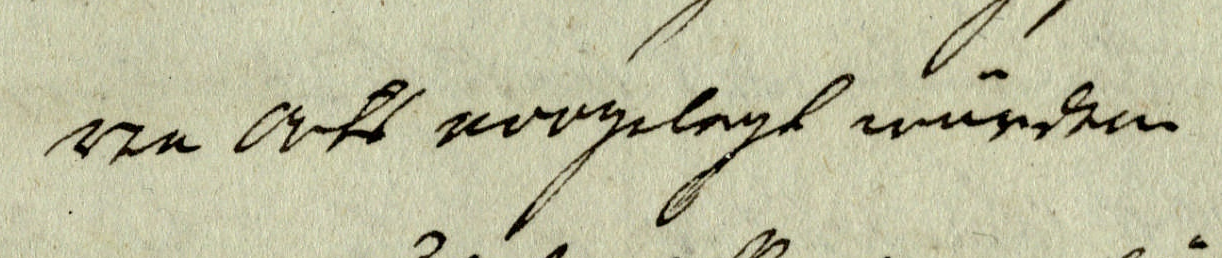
ren Orts vorgelegt würden.
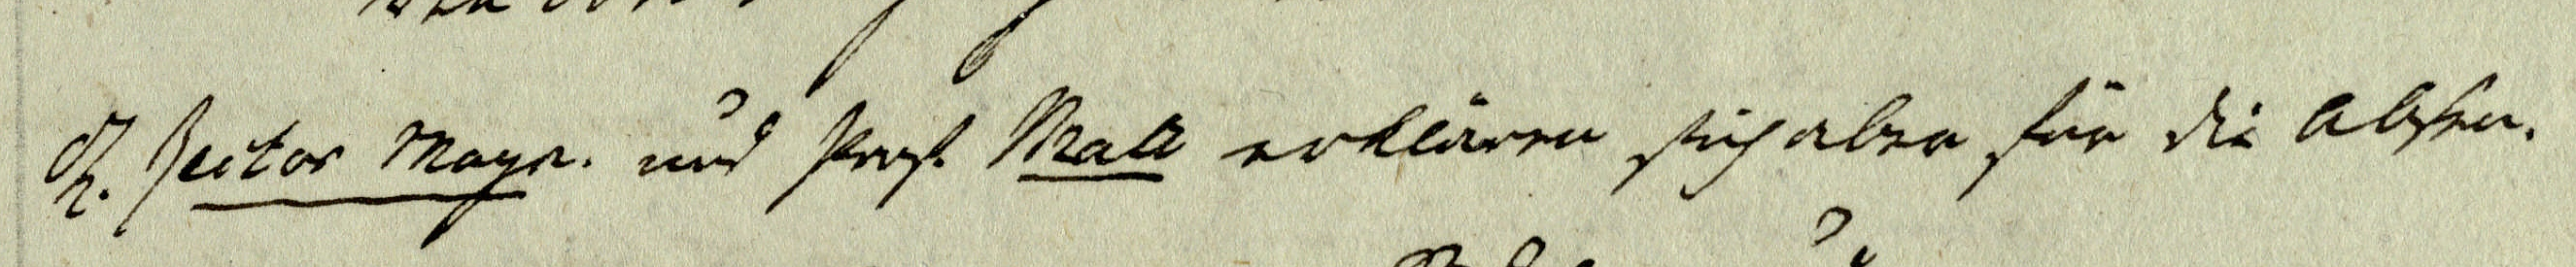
dh. Rector Magn. und Prof. Bratt erklären sich aber für die Absen¬
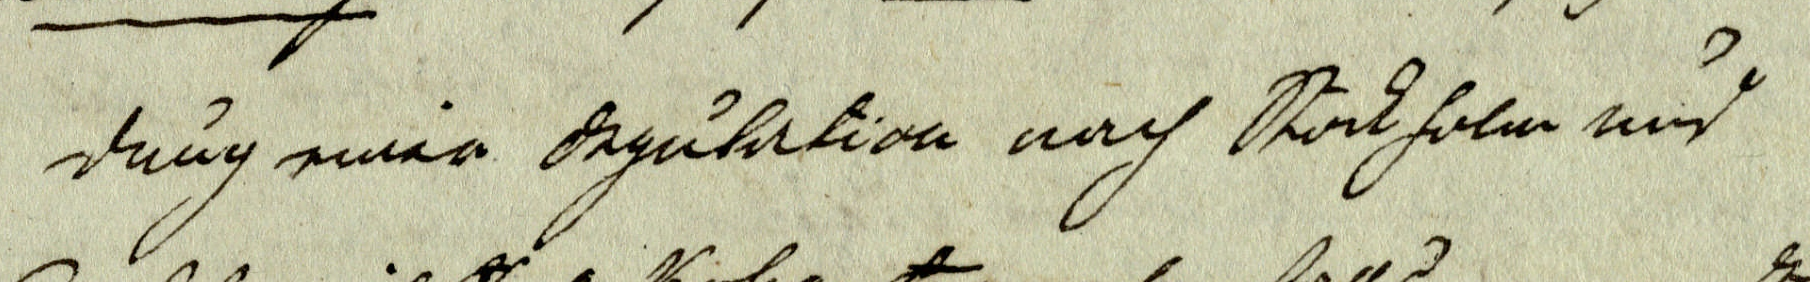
dung einer Deputation nach Stockholm und
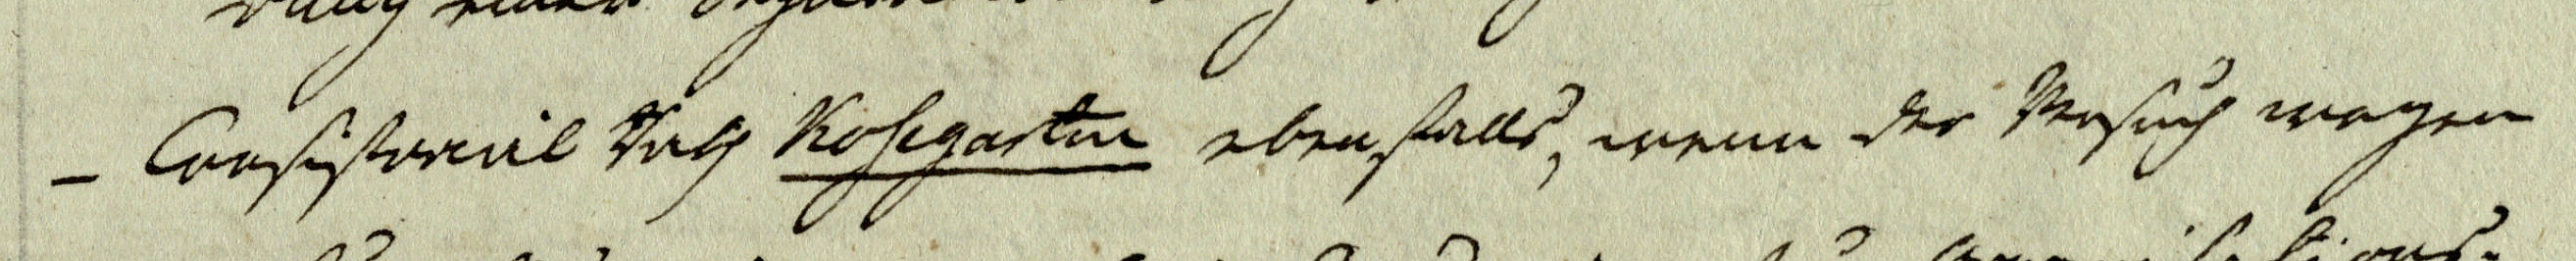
Consistorial Rath Kosegarten ebenfalls, wenn der Versuch wegen
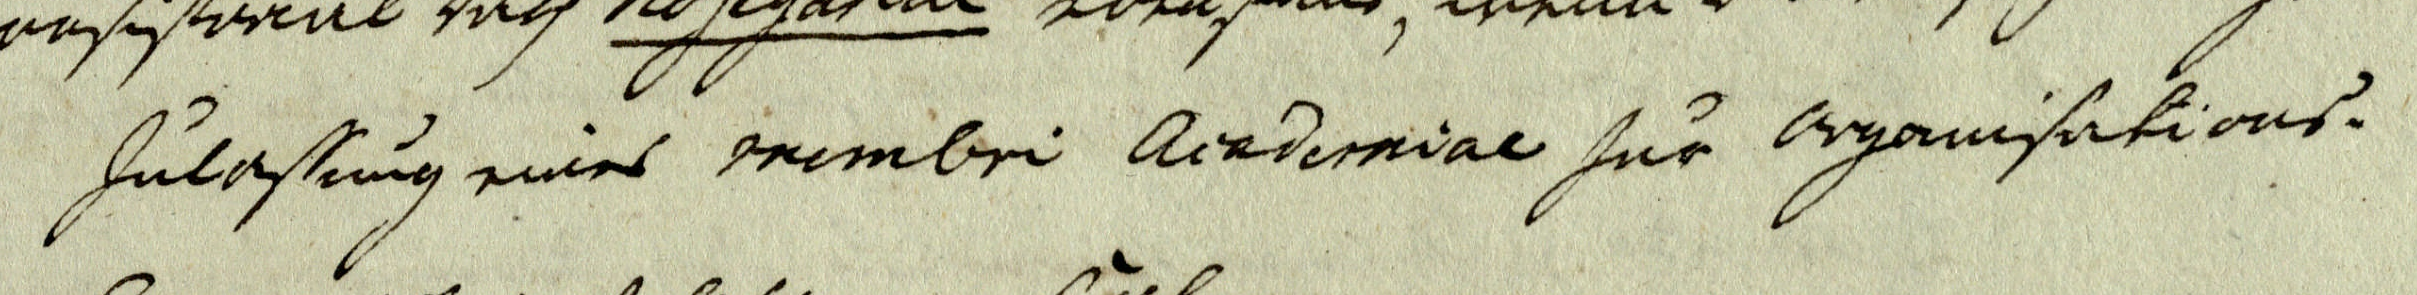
Zulassung eines membri Academiae zur Organisations¬
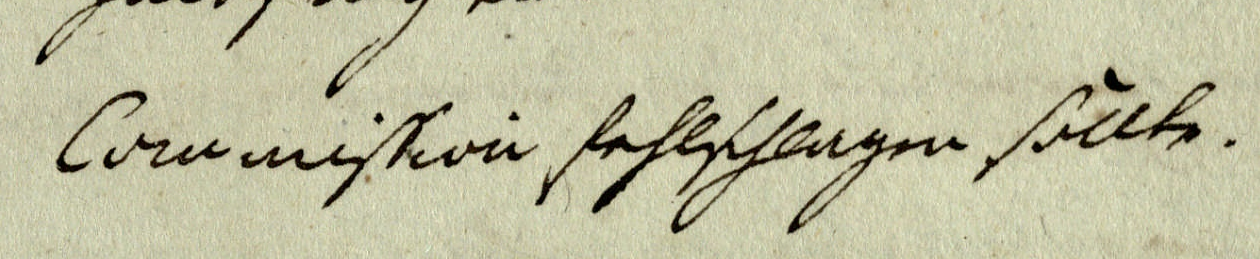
Commission fehlschlagen sollte.
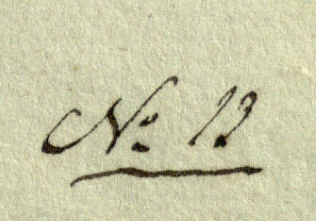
No 13
